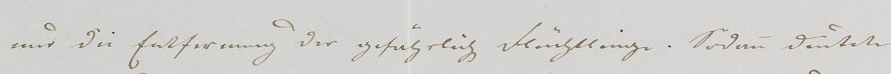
nur die Entfernung der gefährlichen Flüchtlinge. Sodann deutete
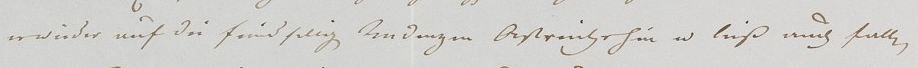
er wieder auf die feindseligen Tendenzen Oestreichs hin u ließ auch fallen,
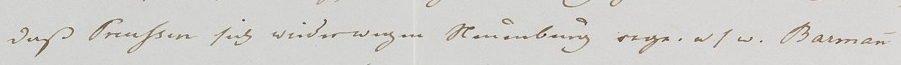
daß Preussen sich wieder wegen Neuenburg rege. usw. Barmann
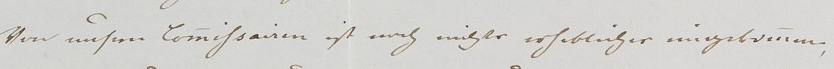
Von unsern Commissairen ist noch nichts erhebliches eingekommen;
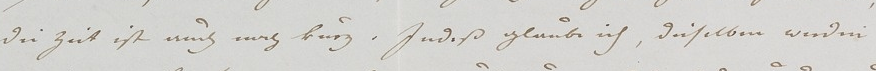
die Zeit ist auch noch kurz. Indeß glaube ich, dieselben werden
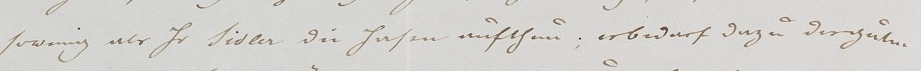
so wenig als Hr Sidler die Hasen aufthun; es bedarf dazu des guten
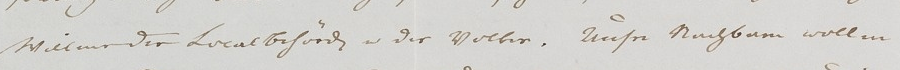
Willens der Local Behörden u des Volkes. Unsre Nachbarn wollen
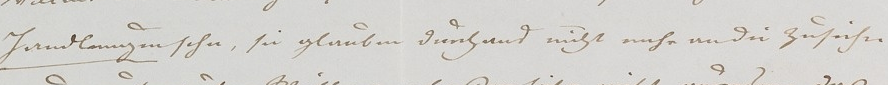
Handlungen sehn, sie glauben durchaus nicht mehr an die Zusiche-
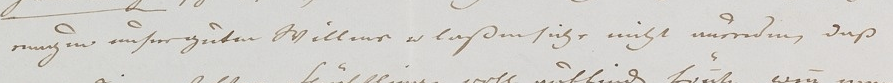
rungen unsers guten Willens u laßen sichs nicht ausreden, daß
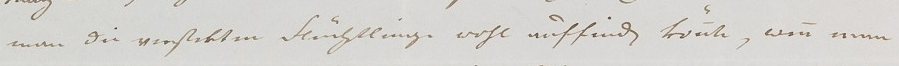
man die verstekten Flüchtlinge wohl auffinden könnte, wenn man
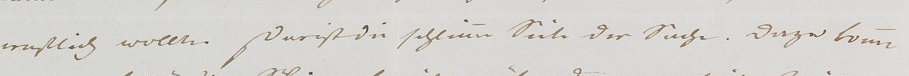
ernstlich wollte. Das ist die schlimme Seite der Sache. Dazu kommen
